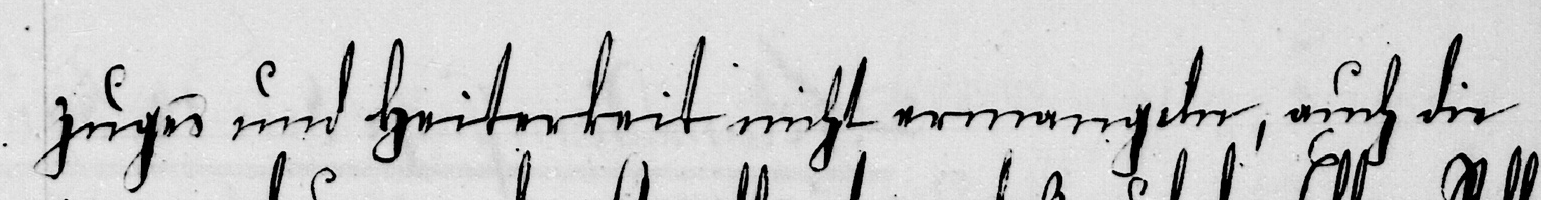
zuges und Heiterkeit nicht ermangeln, auch die
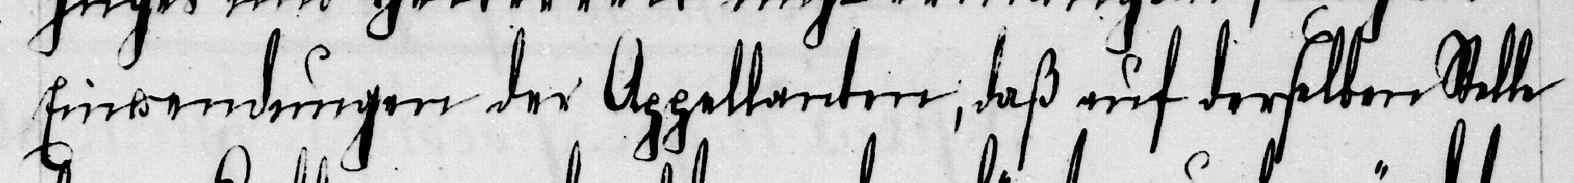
Einwendungen der Appellanten, daß auf derselben Stelle
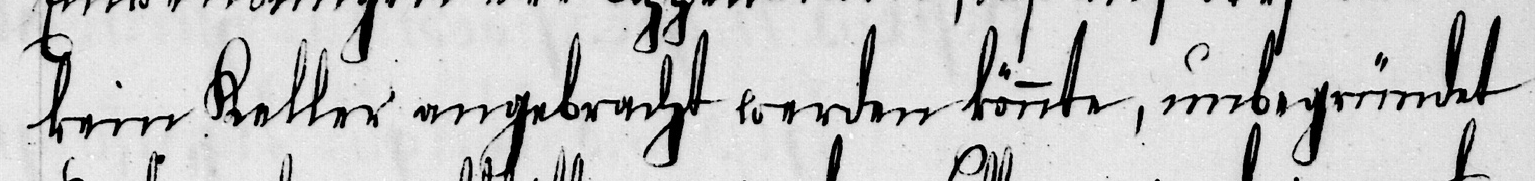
kein Keller angebracht werden könnte, unbegründet
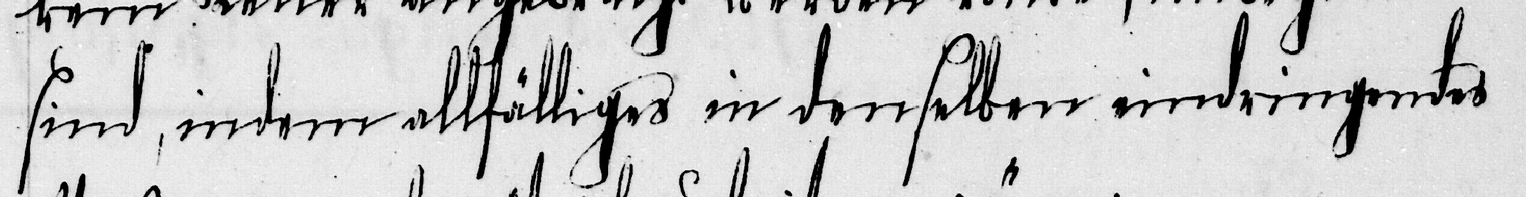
sind, indem allfälliges in denselben eindringendes
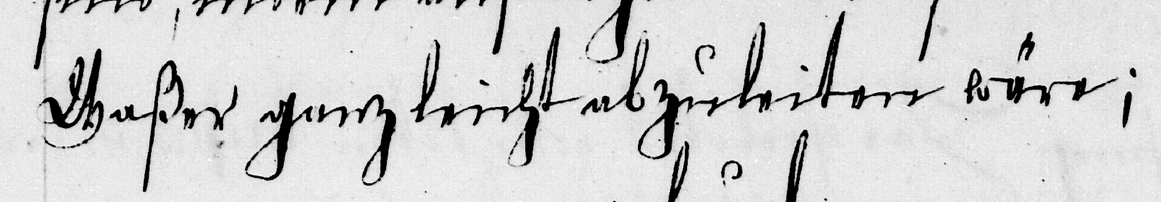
Waßer ganz leicht abzuleiten wäre;
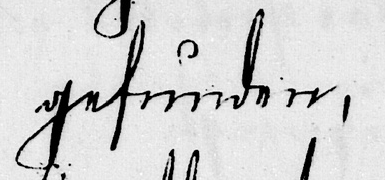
gefunden,
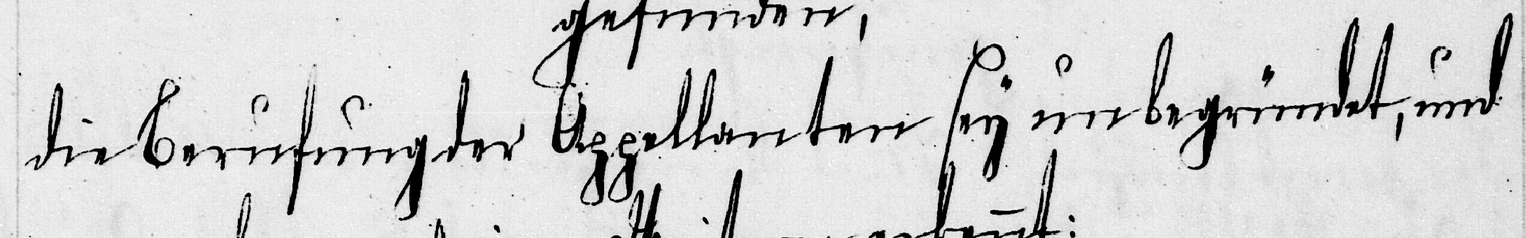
die Berufung der Appellanten sey unbegründet, und
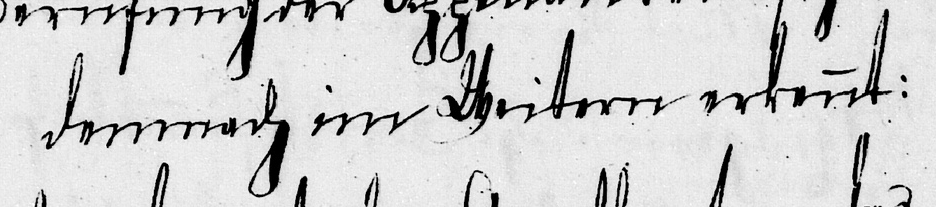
demnach im Weitern erkennt:
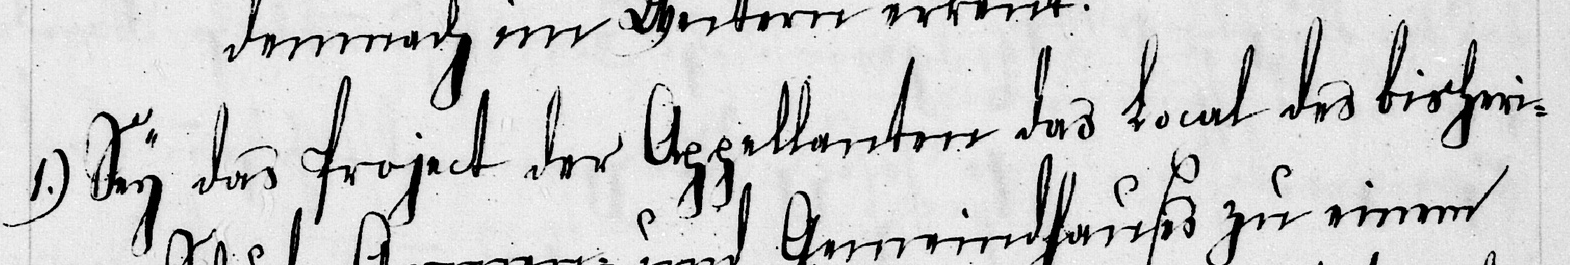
Sey das Project der Appellanten das Local des bisher¬
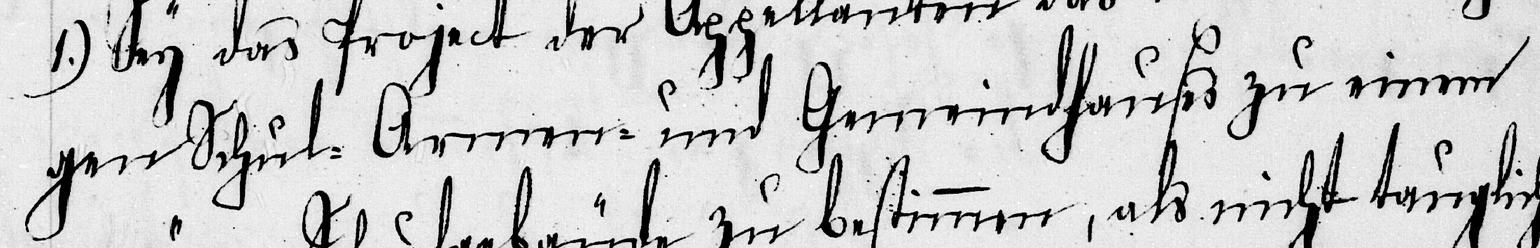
igen Schul-[,] Armen- und Gemeindhauses zu einem
